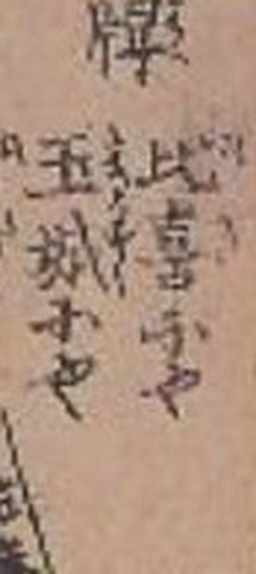山城にや
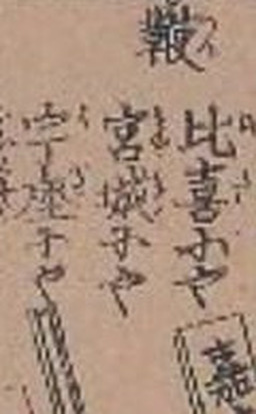宮平にや
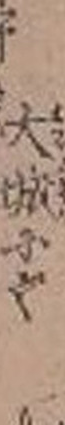大城にや

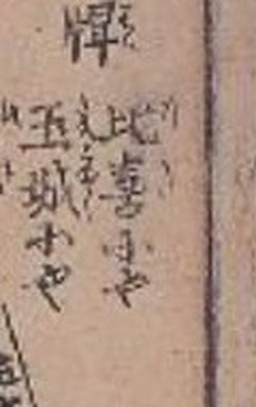比喜にや
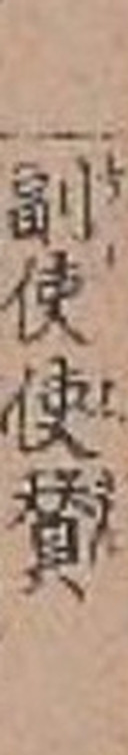副使使賛
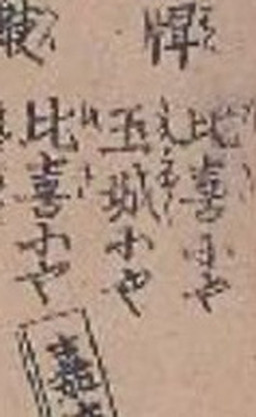玉城にや
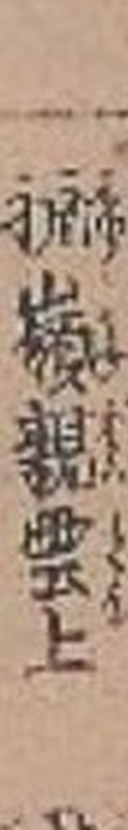赤嶺親雲上
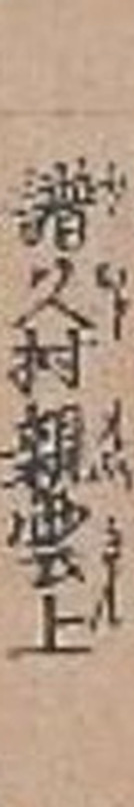譜久村親雲上
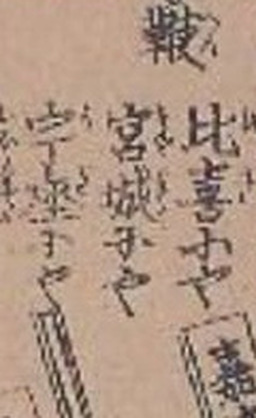宮城にや
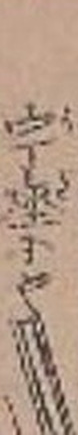宇座にや
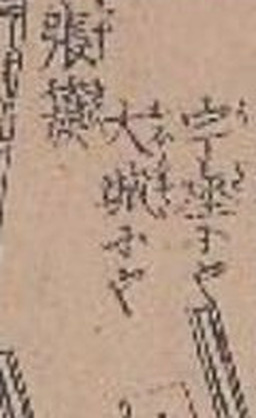大城にや
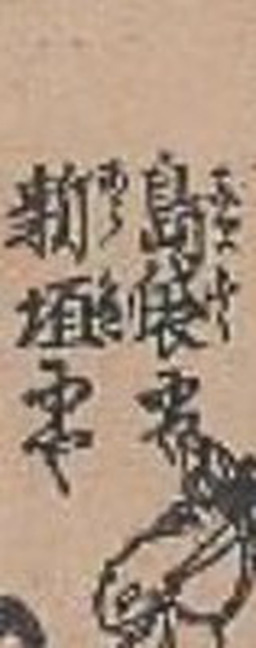新垣にや
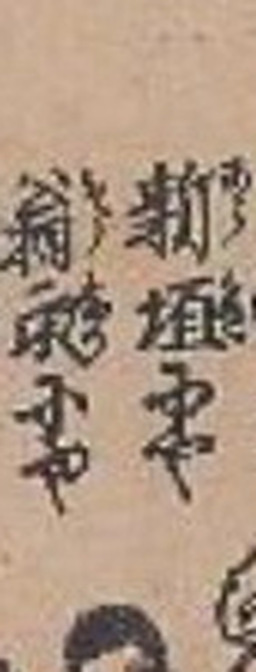翁永にや
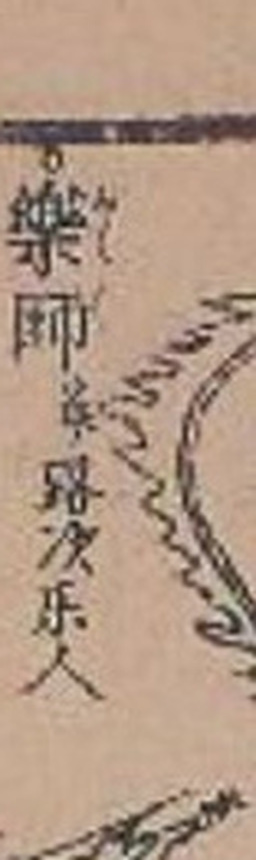○楽師並路次楽人
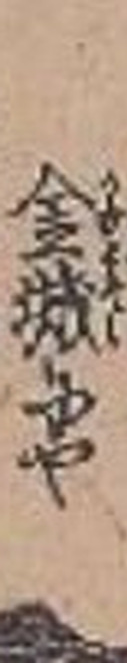金城にや
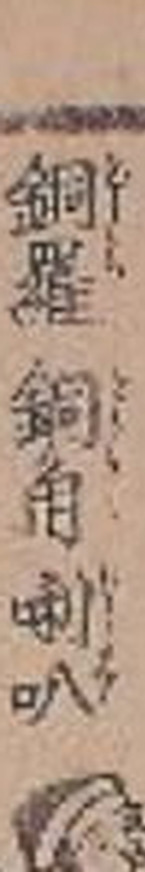銅羅銅角唎叭
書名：琉球人行列附 天保十三壬寅年十一月
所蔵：University of the Ryukyus Library
